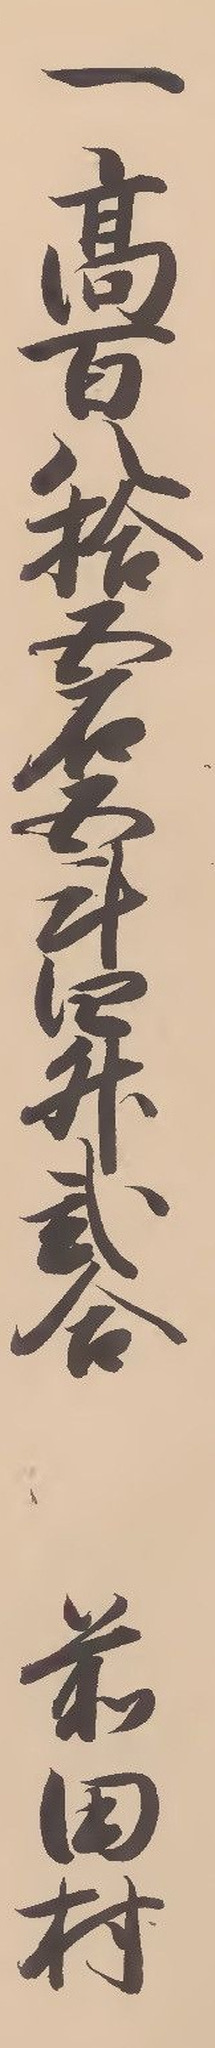一高百八拾五石五斗四升弐合前田村
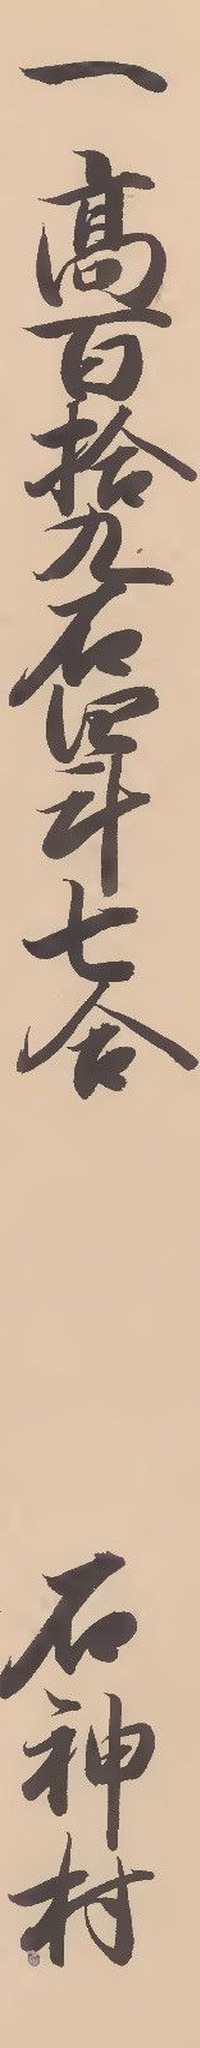一高百拾九石四斗七合石神村
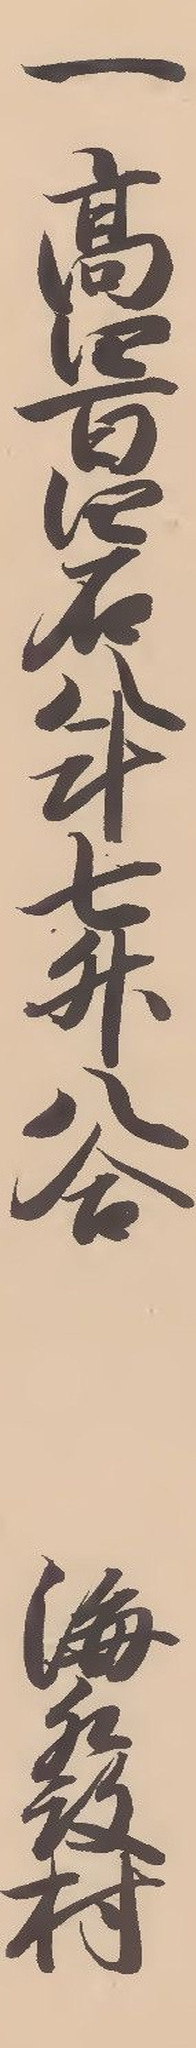一高四百四石八斗七升八合海発村
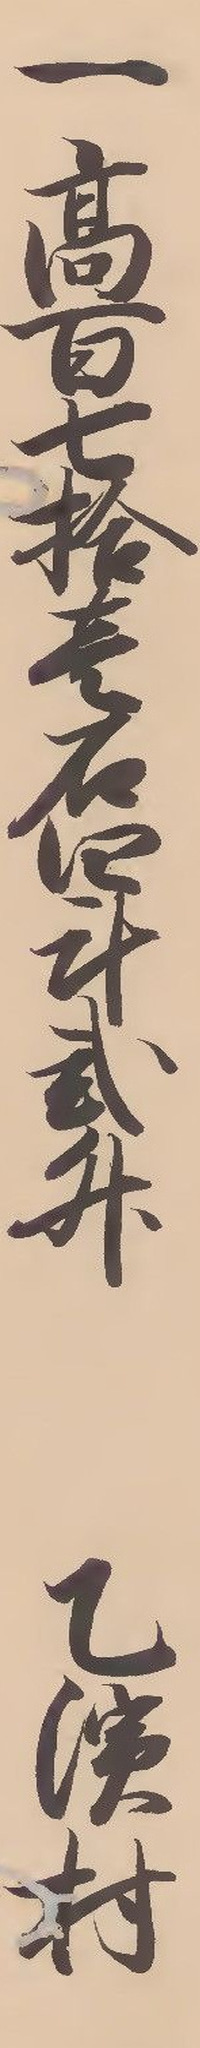一高百七拾壱石四斗弐升乙浜村

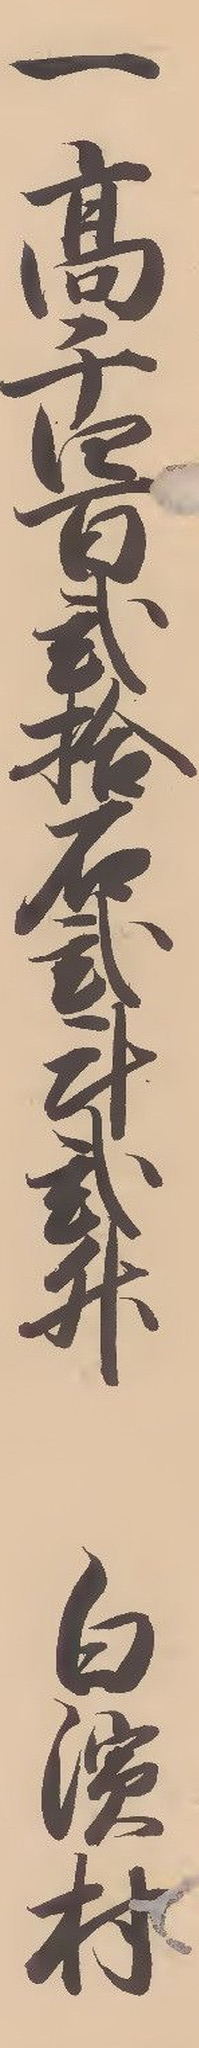一高千四百弐拾石弐斗弐升白浜村
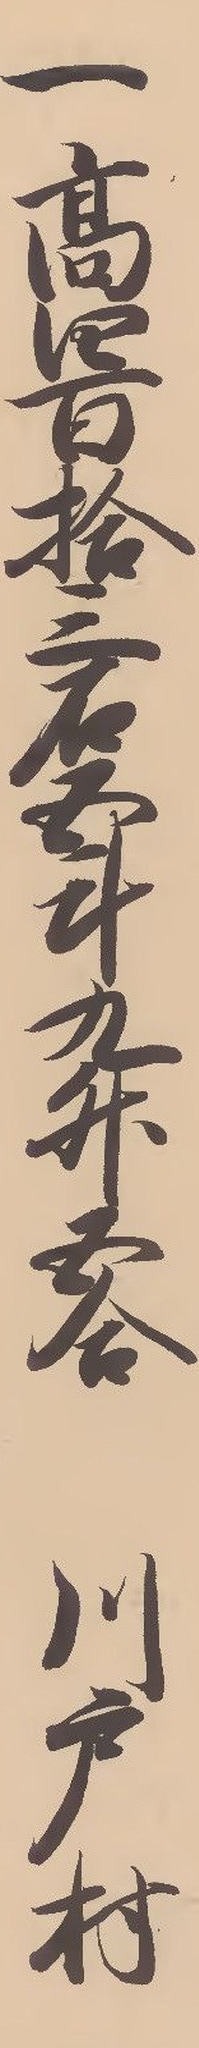一高四百拾三石五斗九升五合川戸村
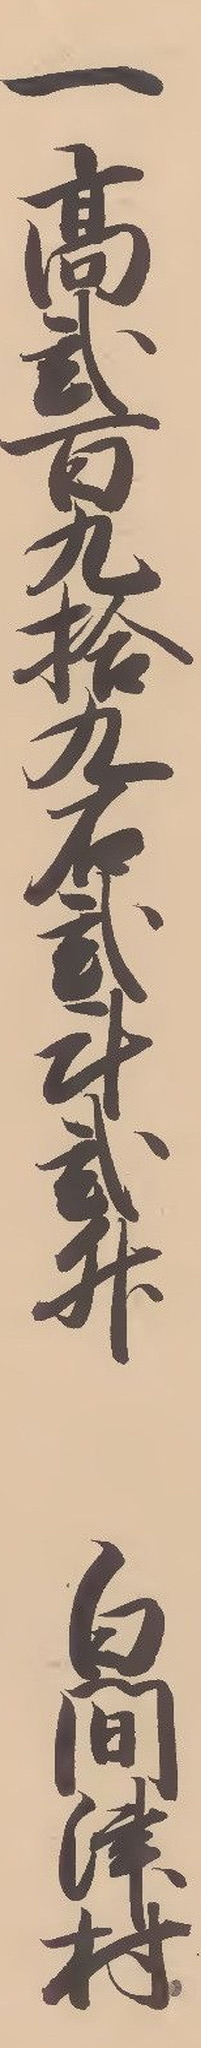一高弐百九拾九石弐斗弐升白間津村
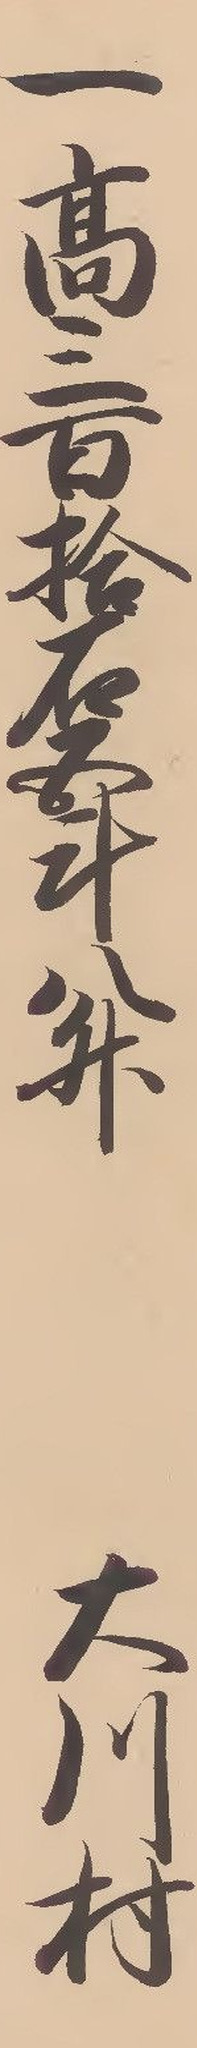一高三百拾石五斗八升大川村
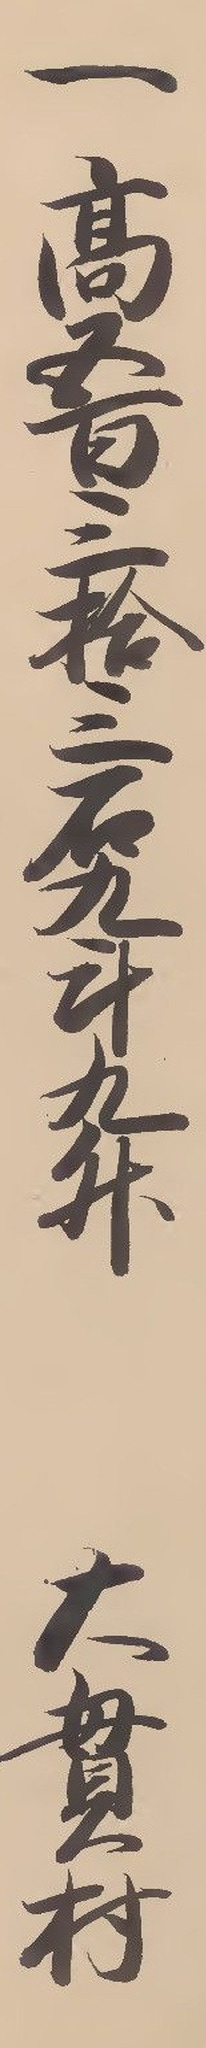一高五百三拾三石九斗九升大貫村
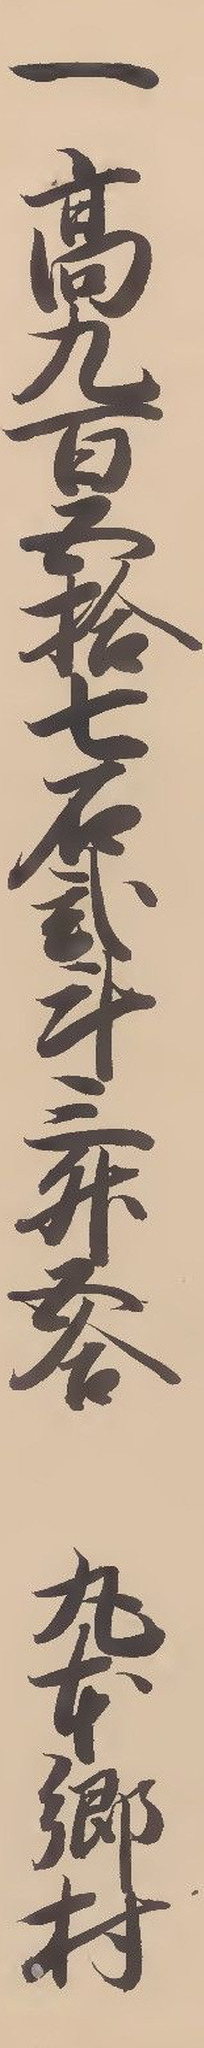一高九百五拾七石弐斗三升五合丸本郷村
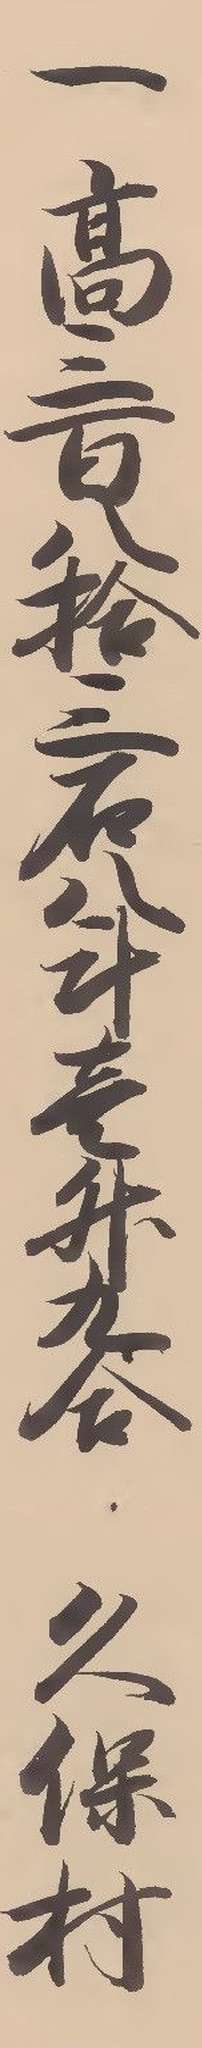一高三百八拾三石八斗壱升九合久保村
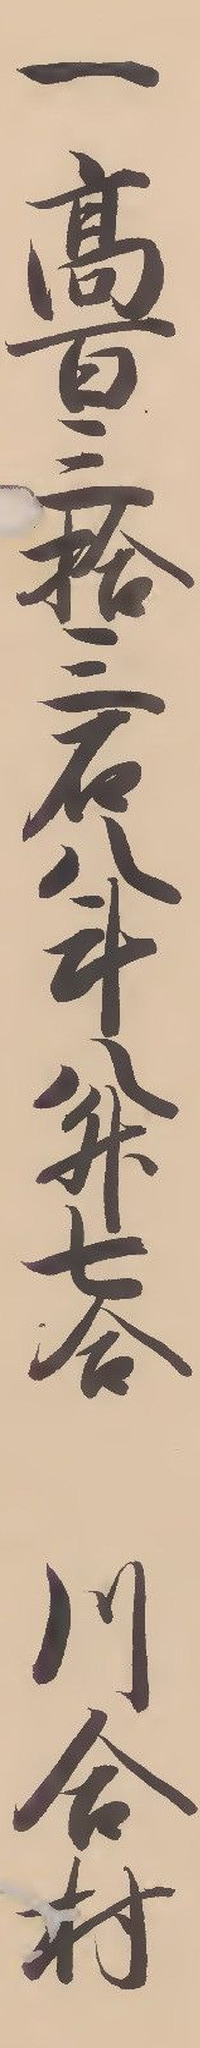一高百三拾三石八斗八升七合川合村

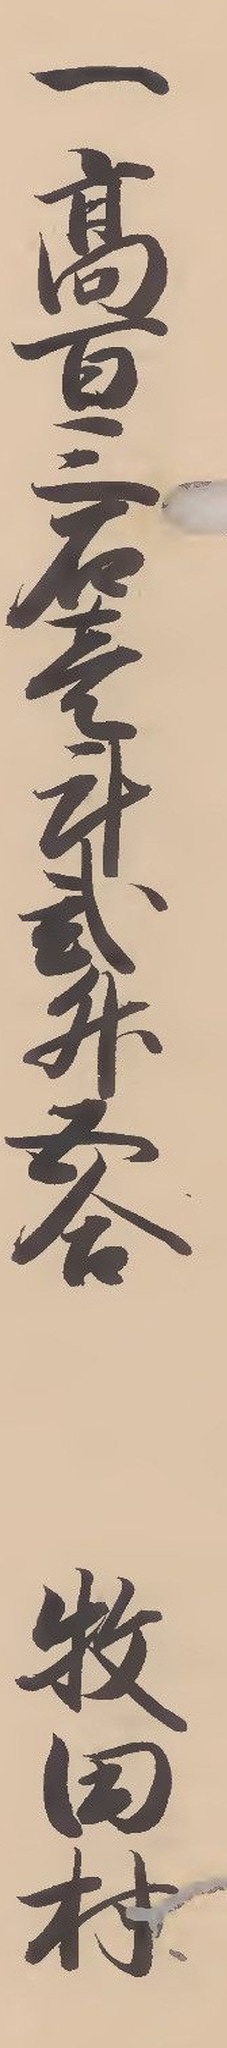一高百三石壱斗弐升五合牧田村
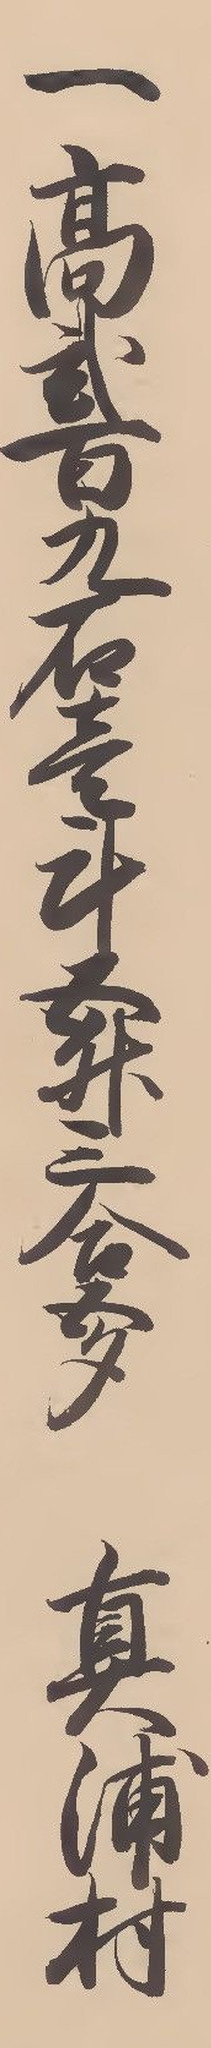一高弐百九石壱斗五升三合五勺真浦村
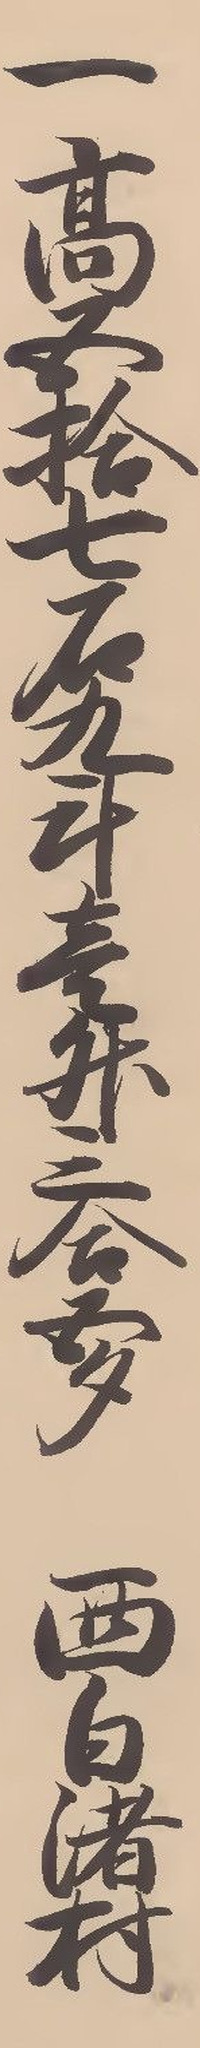一高五拾七石九斗壱升三合五勺西白渚村
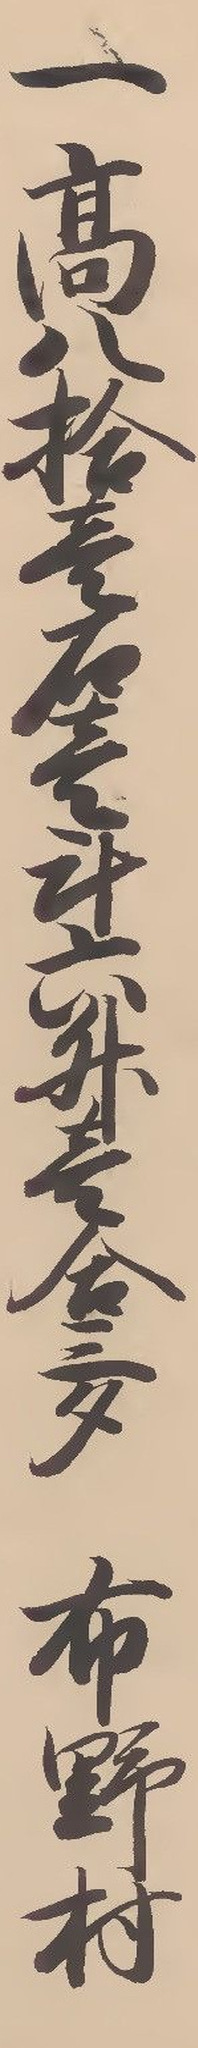一高八拾壱石壱斗六升壱合三勺布野村
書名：安房国郷帳
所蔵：国立公文書館 National Archives of Japan
